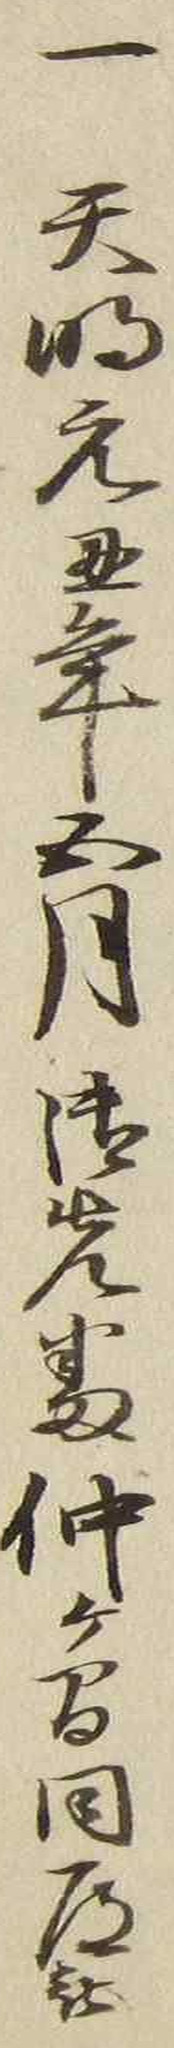一天明元丑年五月御先番仲ヶ間同道被

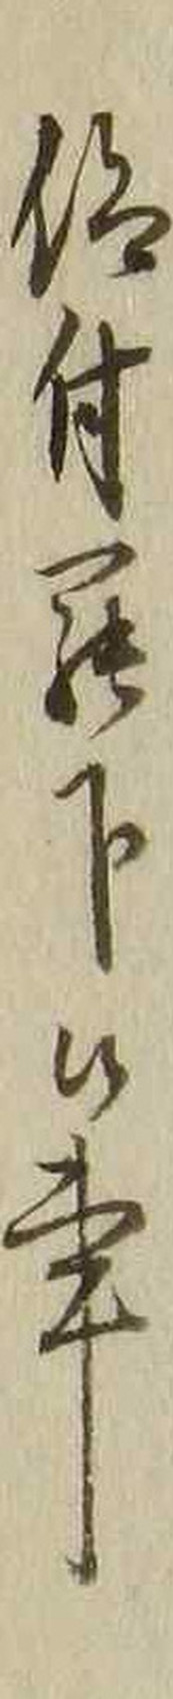仰付罷下候事
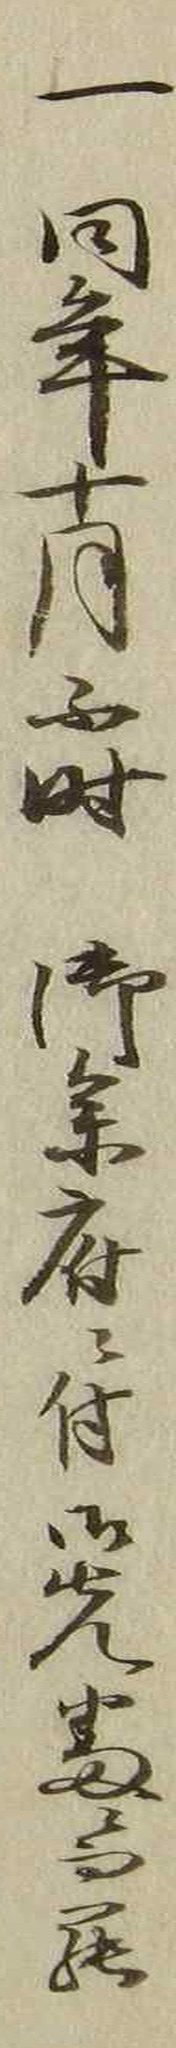一同年十月ふ時御参府ニ付御先番ニ而罷下
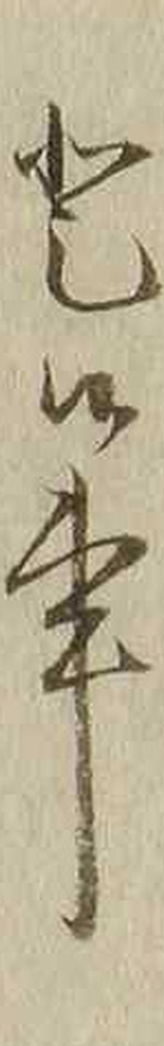登候事
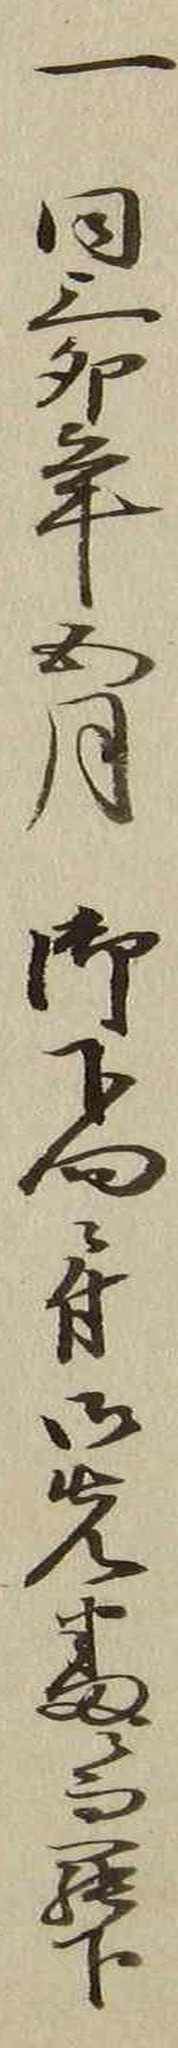一同三夘年五月御下向ニ付御先番ニ而罷下
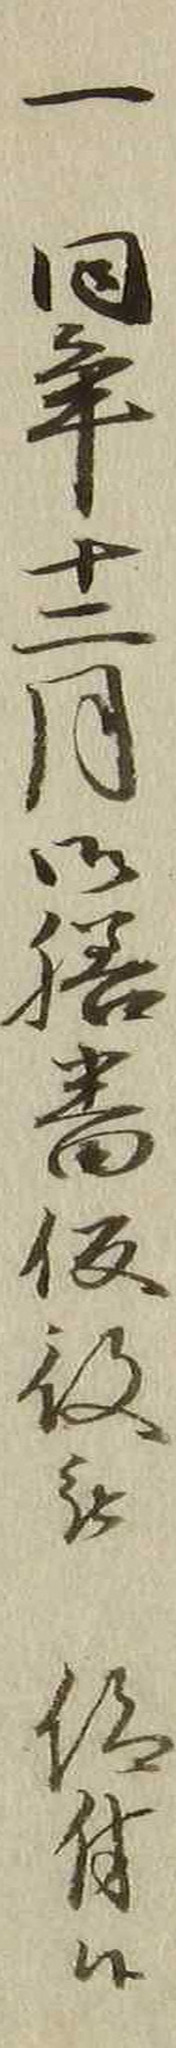一同年十二月御膳番仮役被仰付候
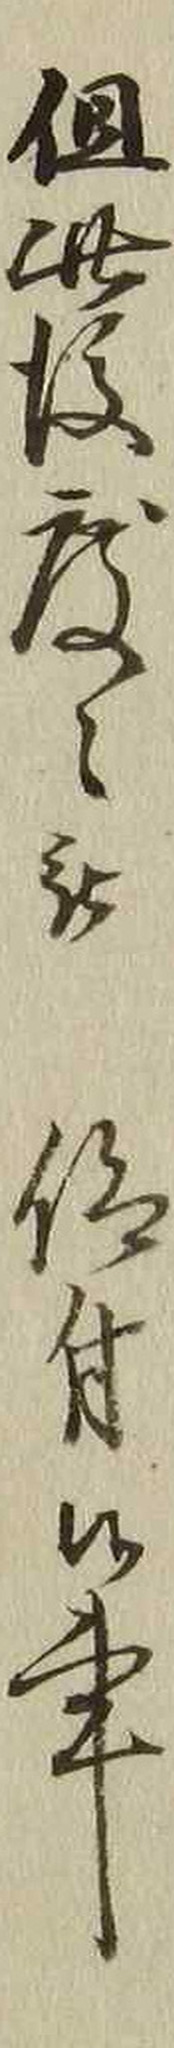但此後度々被仰付候事
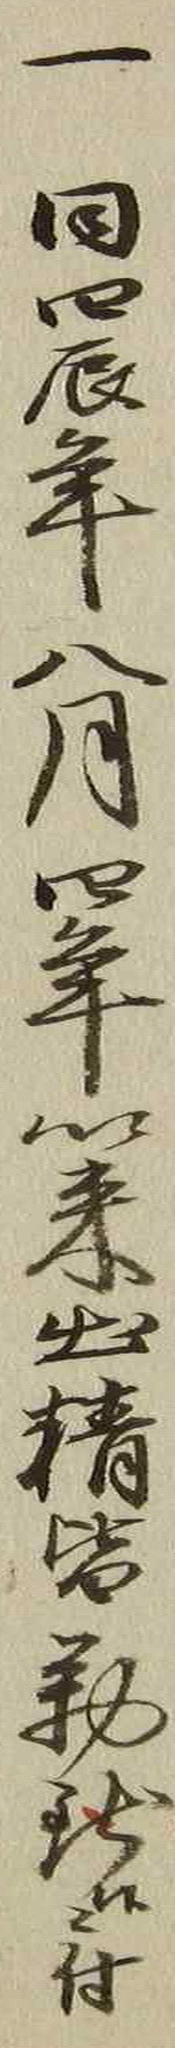一同四辰年八月四年以来出精皆勤致候ニ付
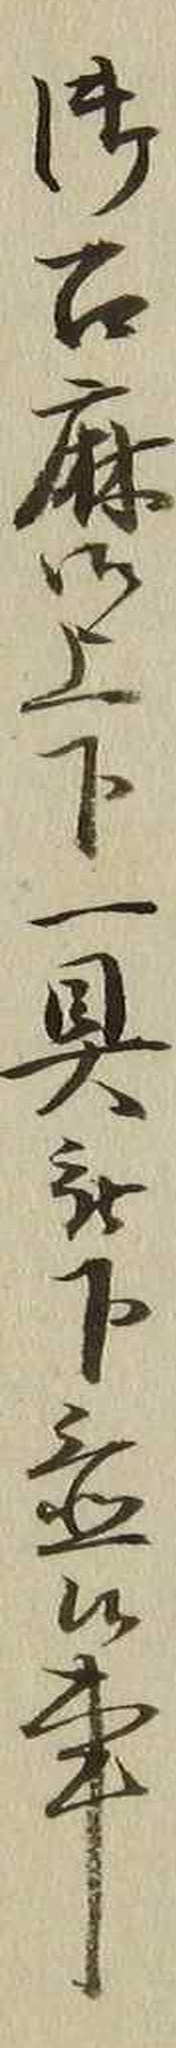御召麻御上下一具被下置候事
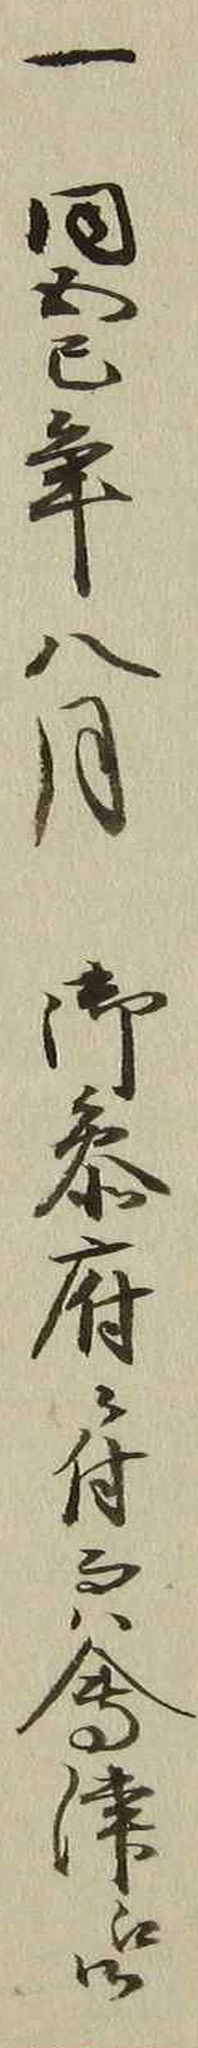一同五巳年八月御参府ニ付而ハ会津江御
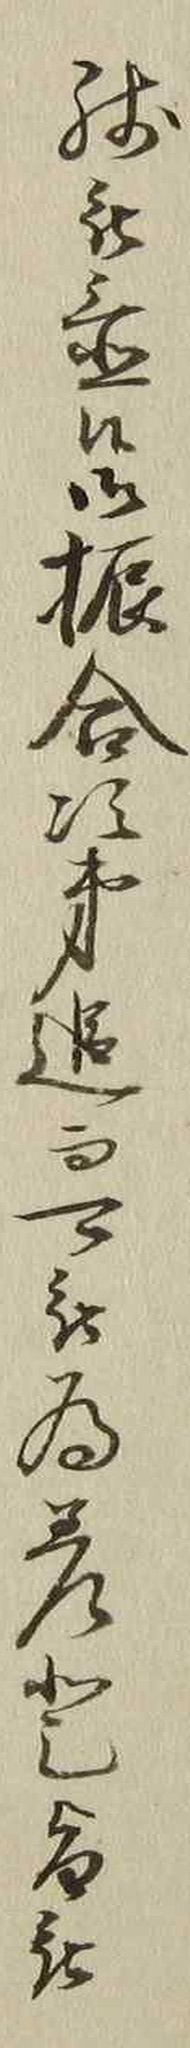残被置候御振合次第追而可被為差登旨被
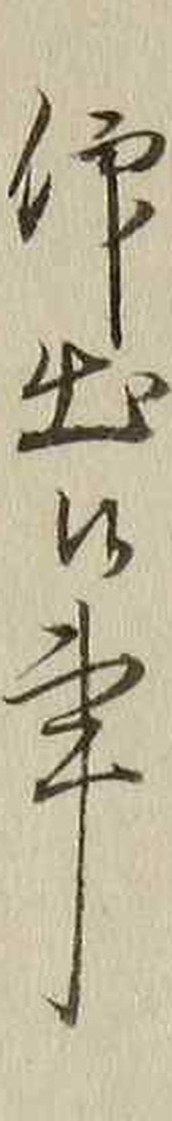仰出候事
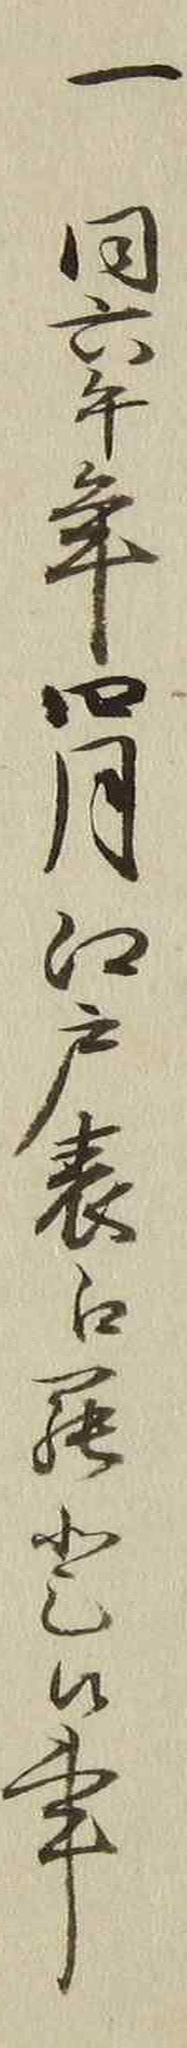一同六午年四月江戸表江罷登候事
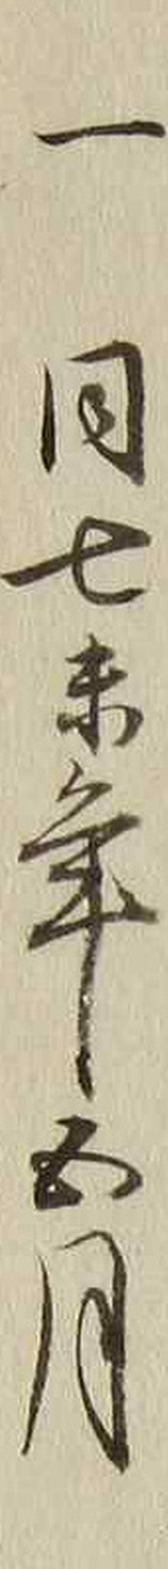一同七未年五月
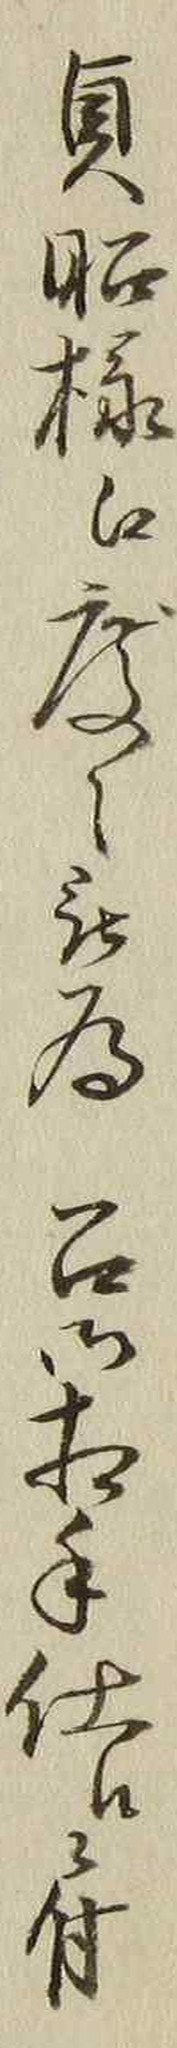貞昭様江度々被為召御相手仕候ニ付
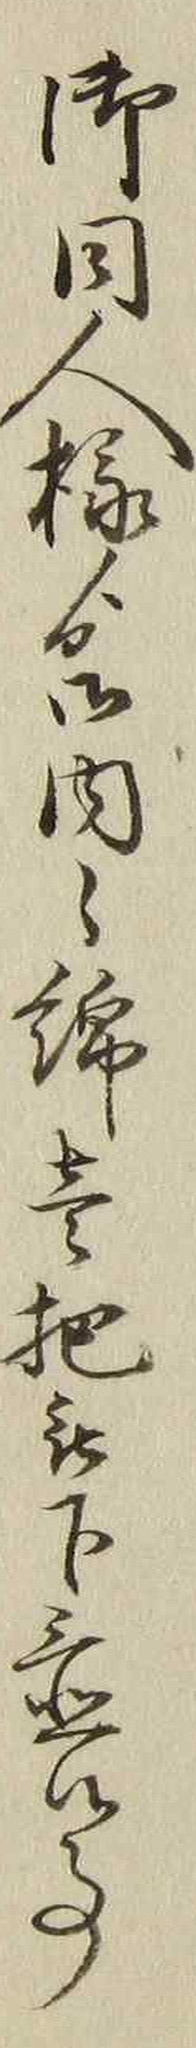御同人様ゟ御内々綿壱把被下置候事
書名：諸士系譜　巻之114　か之部22
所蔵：会津若松市立会津図書館
